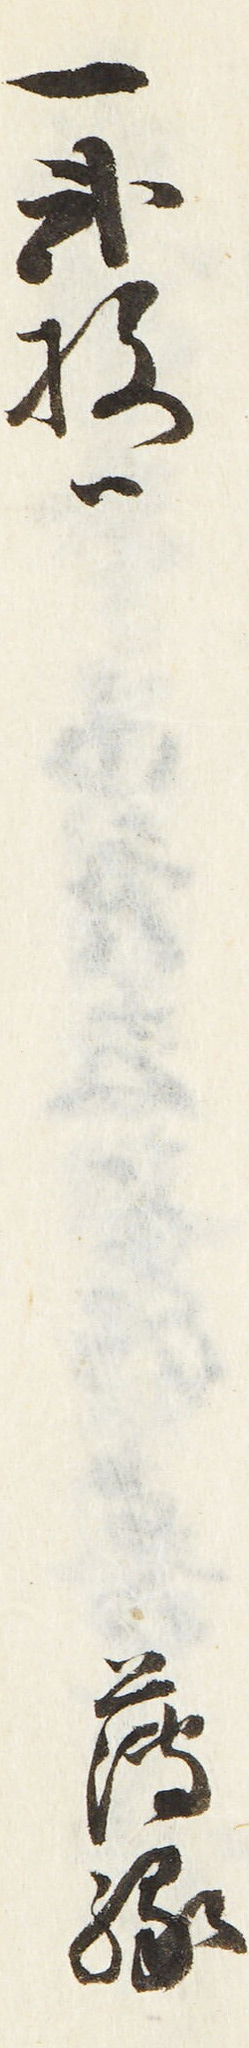一弐枚ハ薄縁
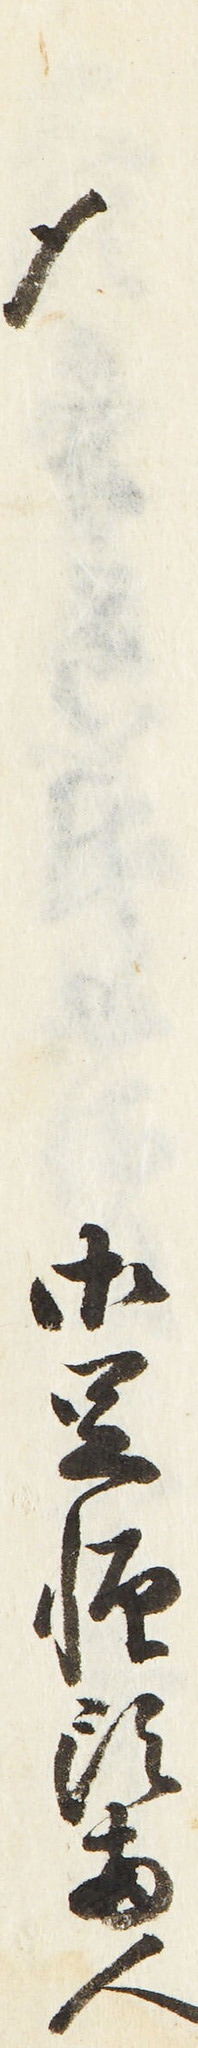〆御足軽頭両人
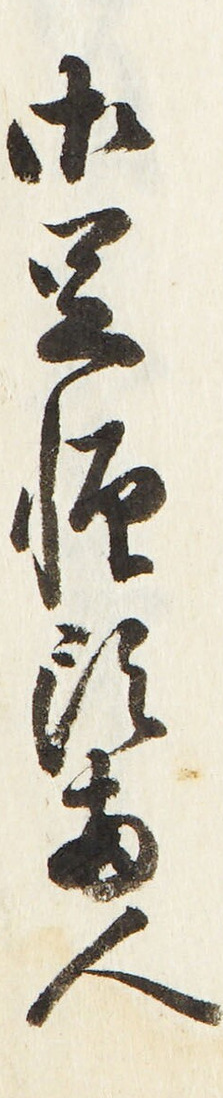〆御足軽頭両人

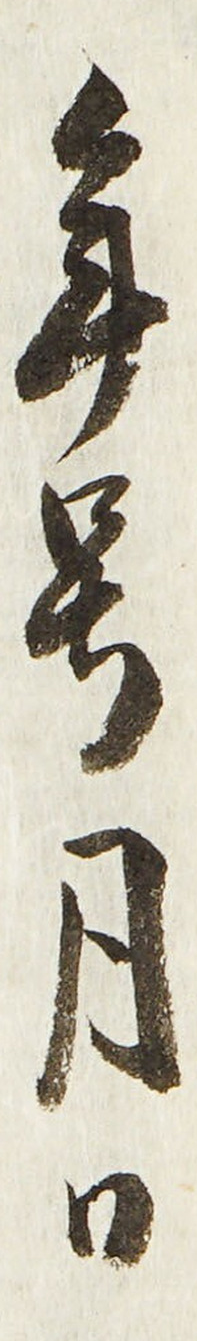年号月日
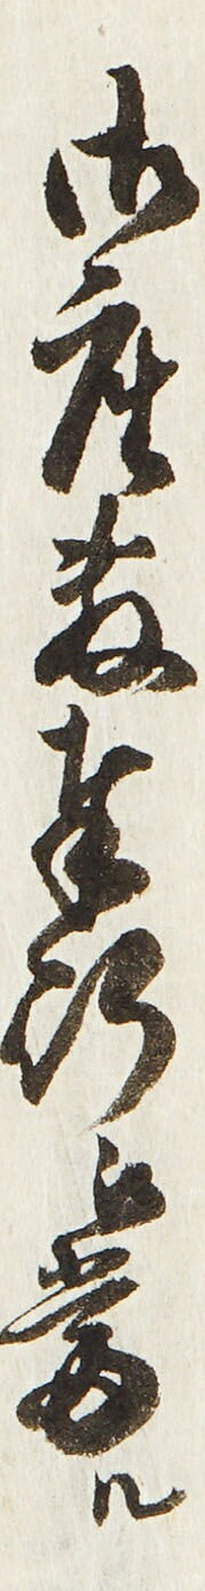御座番奉行江当ル
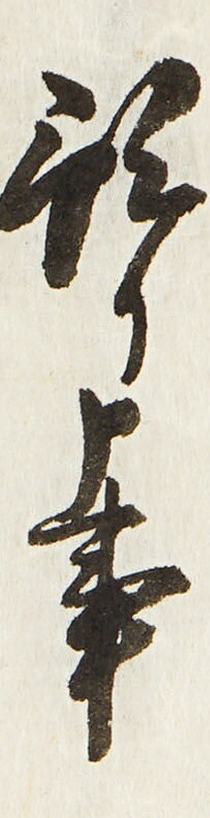預り申事
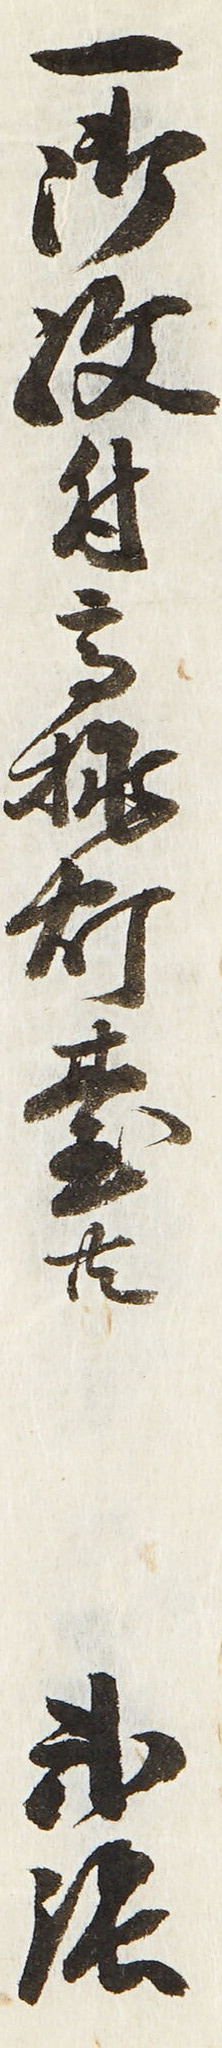一御紋付高挑灯台共弐張
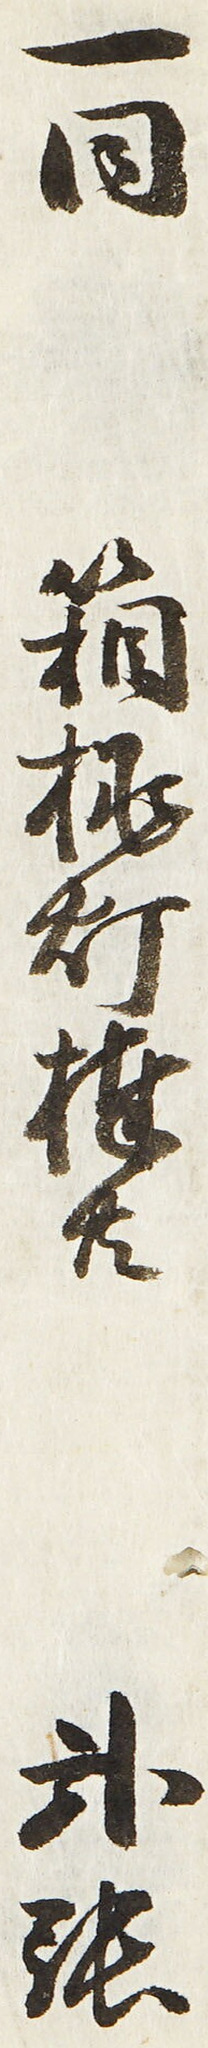一同箱挑灯棒共弐張
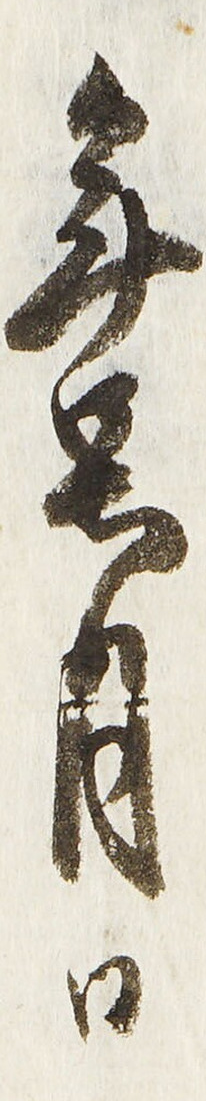年号月日
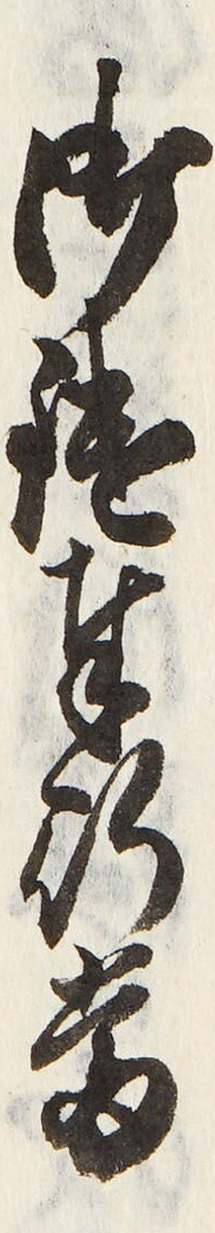御鑓奉行当
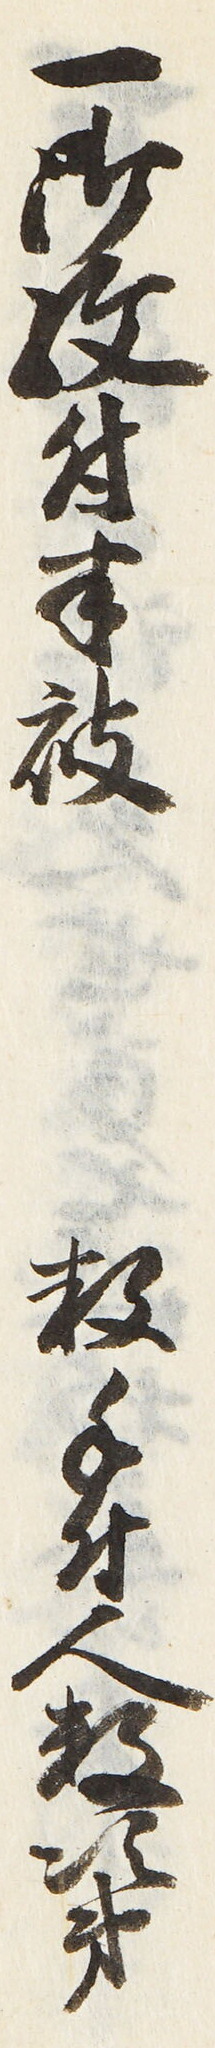一御紋付半被数手付人数次第
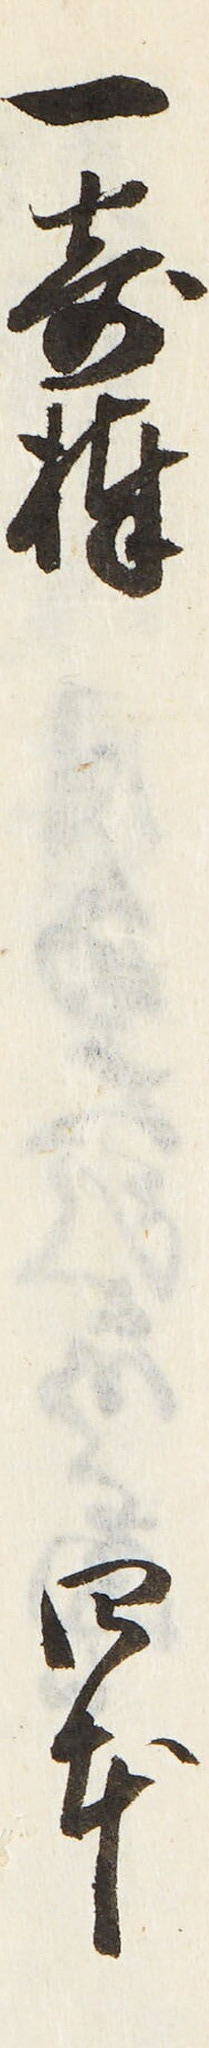一寄棒四本
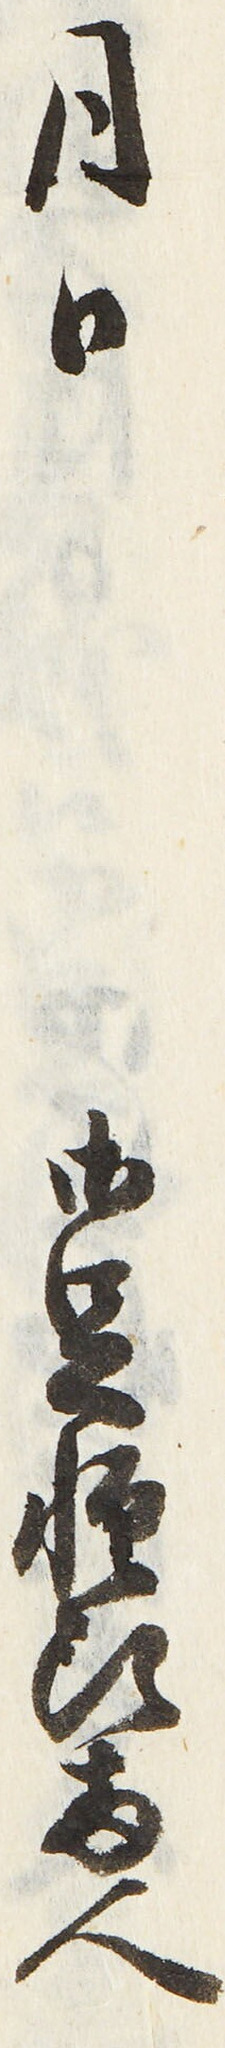月日御足軽頭両人
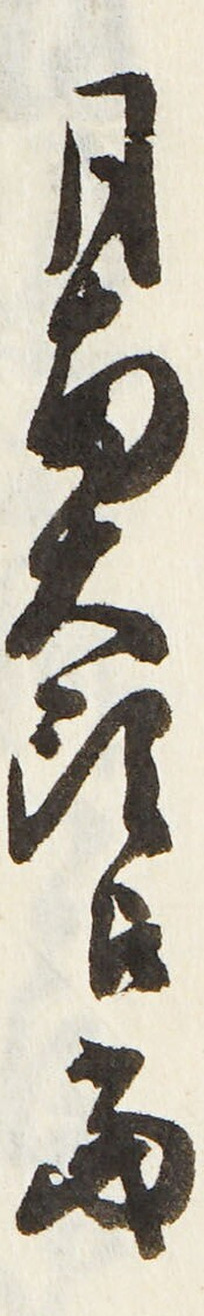月番大頭江当
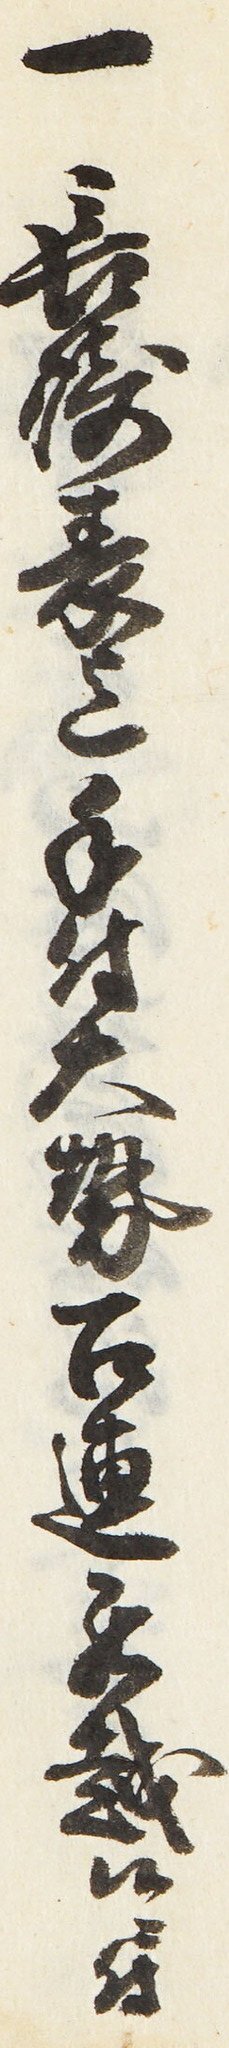一長崎表迄手付大勢召連罷越候ニ付
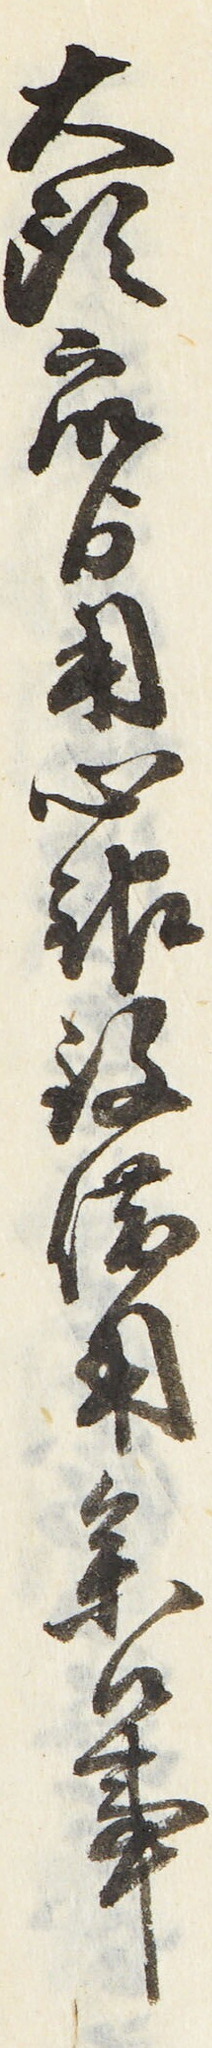大頭衆ゟ用心銀致借用参候事
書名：玄海嶋江漂着船為警固長崎江被越候覚
